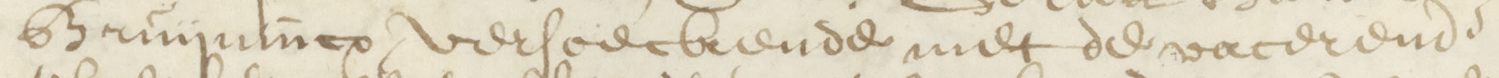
Bruijnincx versoeckende met de vacerende
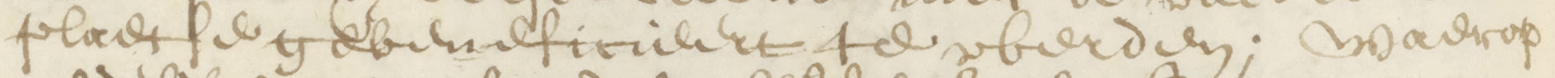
plaetse gebeneficieert te werden; Waerop
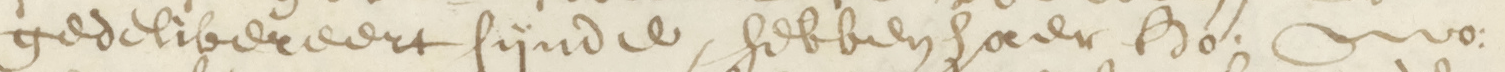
gedelibereert sijnde, hebben haer Ho:Mo:
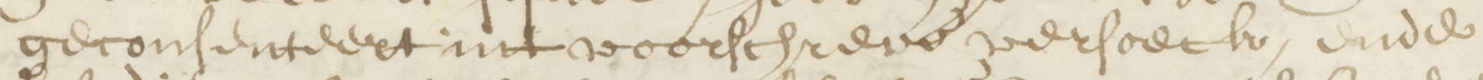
geconsenteert int voorschreve versoeck, ende
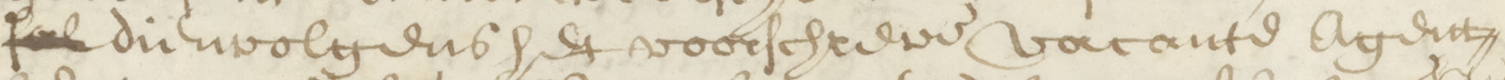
sal dienvolgens het voorschreve vacante Agent„
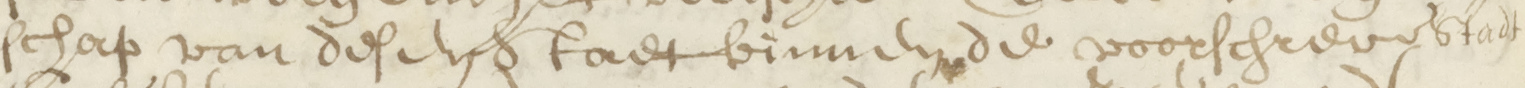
schap van desen Staet binnen de voorschreve Stadt
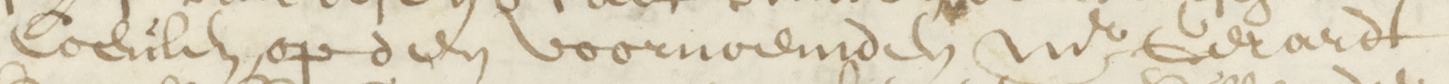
Coeulen op den voornoemden Mr. Gerardt
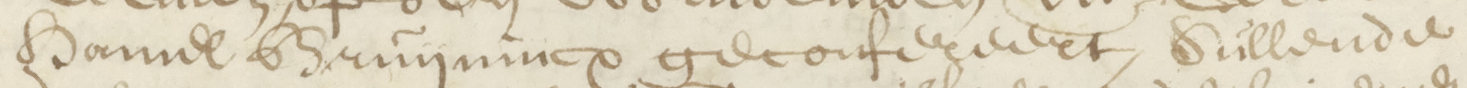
Hamel Bruynincx geconfereert, Sullende
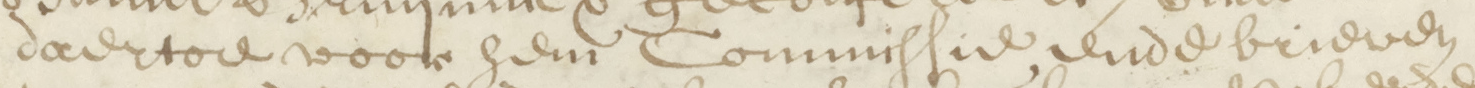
daertoe voor hem Commissie ende brieven
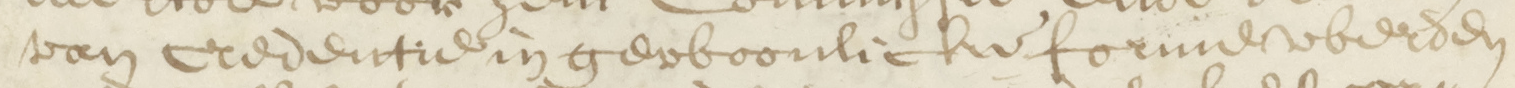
van credentie in gewoonlicke forme werden
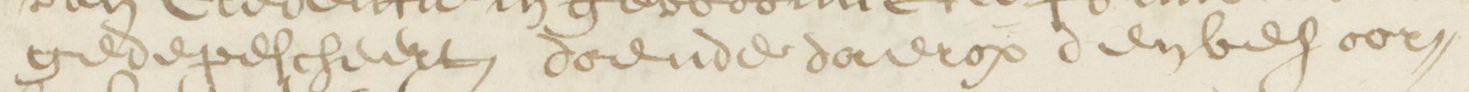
gedepescheert, doende daerop den behoor„
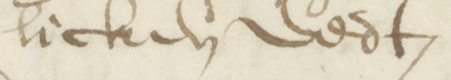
licken Eedt.
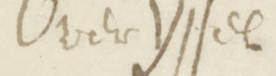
Over Yssel
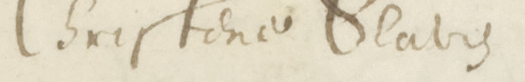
Christene Slaven
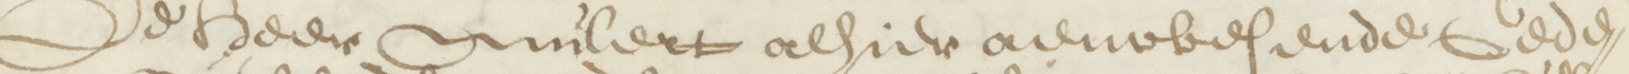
De Heer Mulert alhier aenwesende Gede„
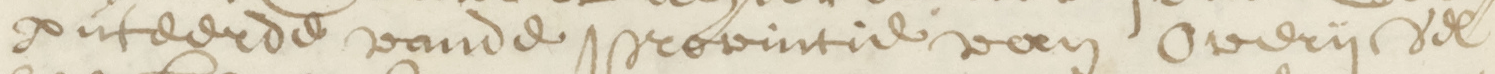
puteerde vande provintie van Overijssel
